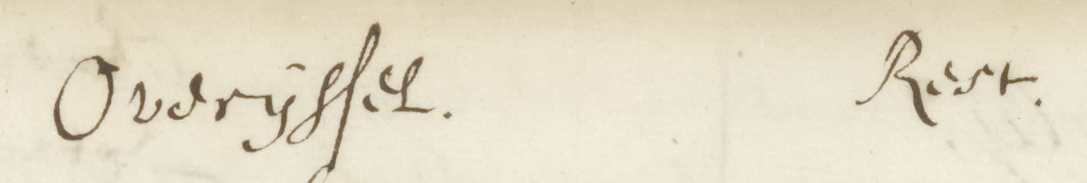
Overijssel. Rest.
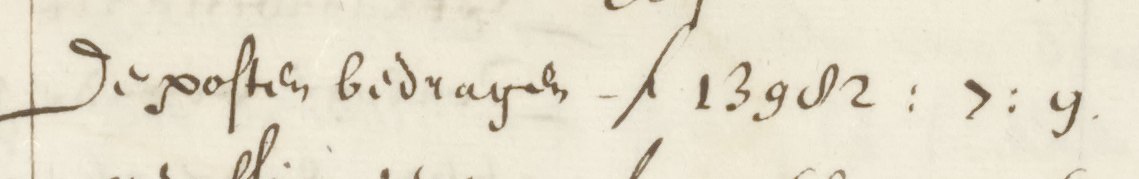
De posten bedragen f 13982: 7: 9.
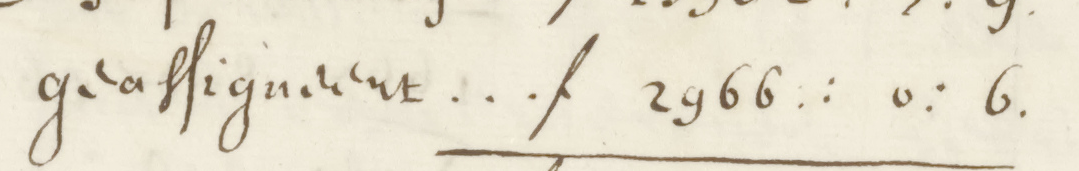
geassigneert...f 2966: 0: 6.
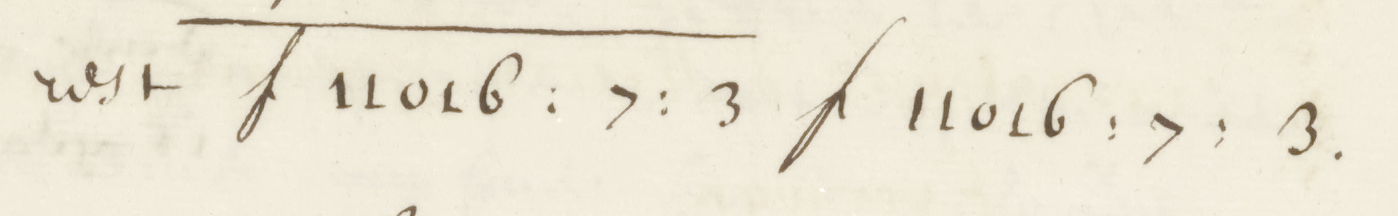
rest f 11016: 7: 3 f 11016: 7: 3.
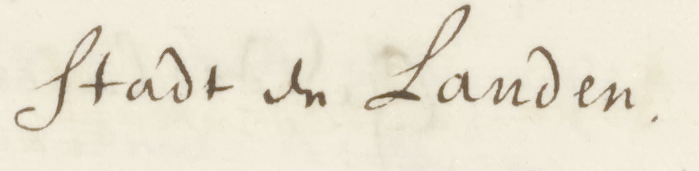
Stadt en Landen.
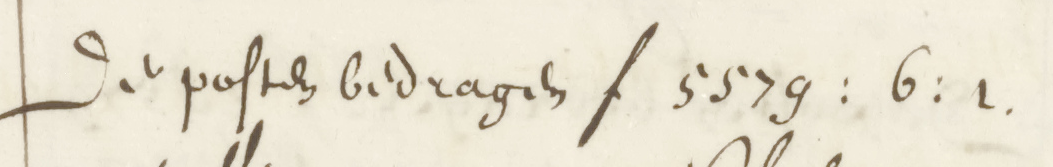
De posten bedragen f 5579: 6: 1.
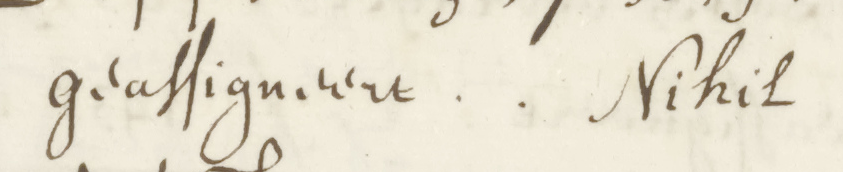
geassigneert.. Nihil
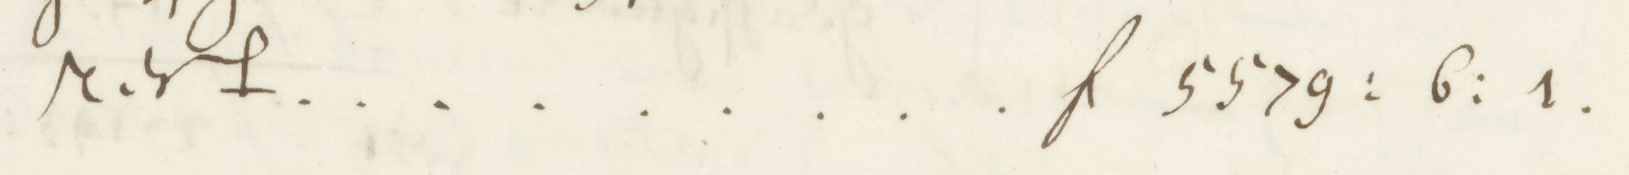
rest......... f 5579: 6: 1.
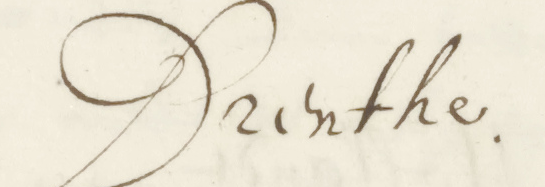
Drenthe.
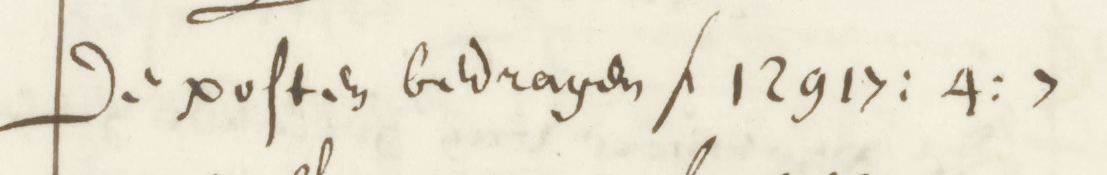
De posten bedragen f 12917: 4: 7
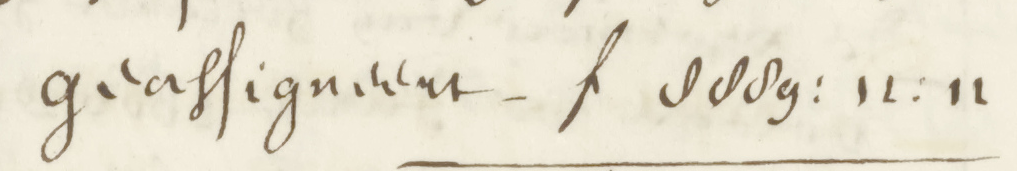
geassigneert f 8889: 11: 11
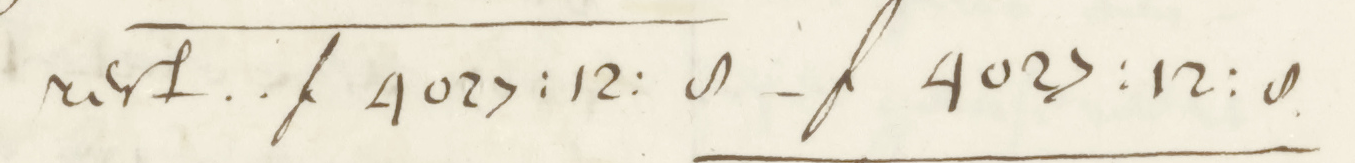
rest.. f 4027: 12: 8. - f 4027: 12: 8.
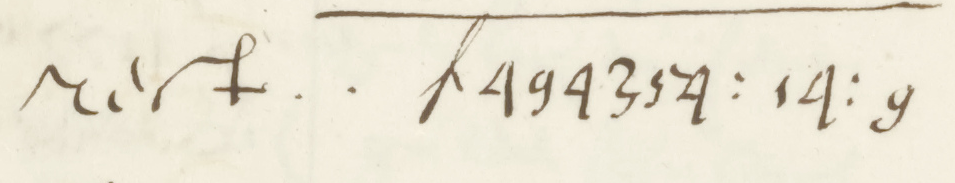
rest.. f 494354: 14: 9
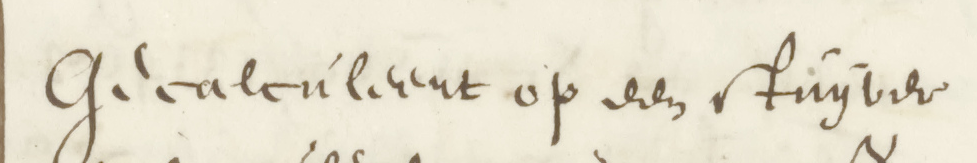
Gecalculeert op een stuijver
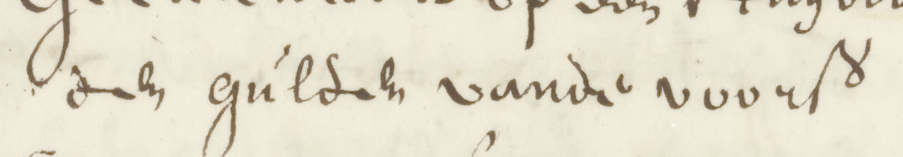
den gulden vande voors
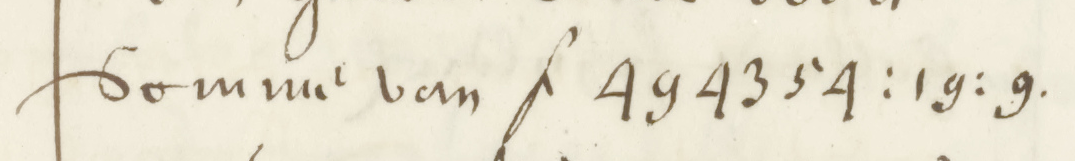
Somme van f 494354: 19: 9.
